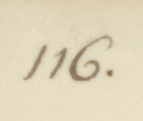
116
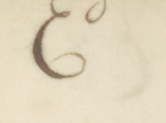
E
